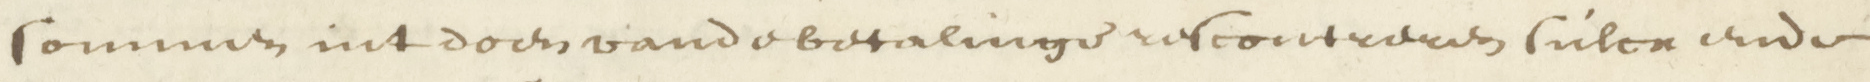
sommen int doen vande betalinge rescontreren sulcx ende
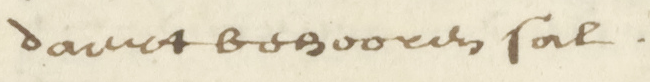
daert behooren sal.
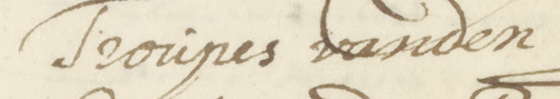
Troupes vanden
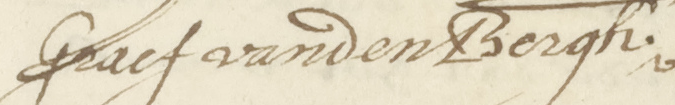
Graef van den Bergh.
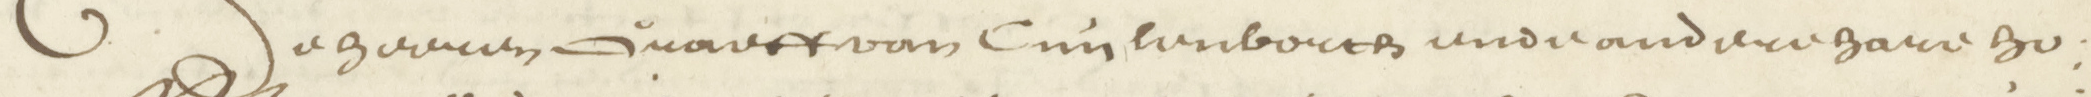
De heeren Graeff van Cuylenborch ende andere hare ho:
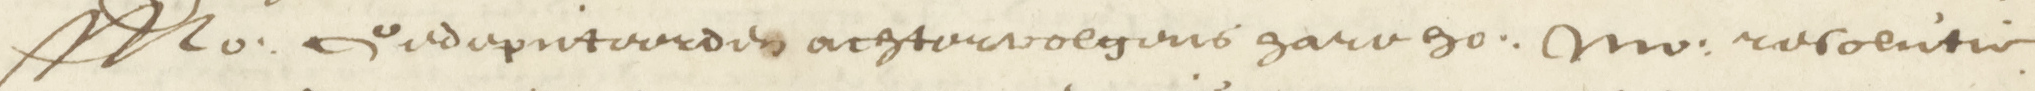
Mo: Gedeputeerden achtervolgens hare ho:Mo: resolutie
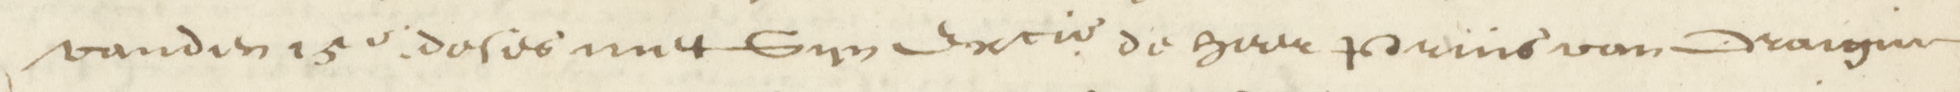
vanden 15e. deses met Syn Excie. de heer Prins van Oraigne
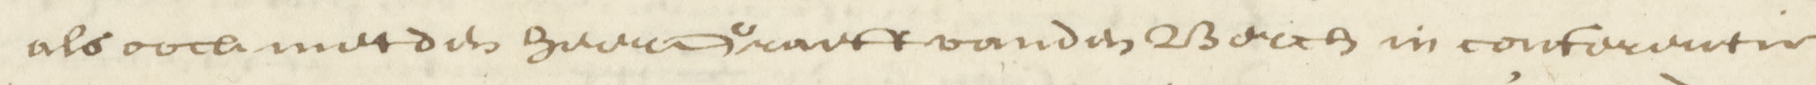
als oock met den heer Graeff vanden Berch in conferentie
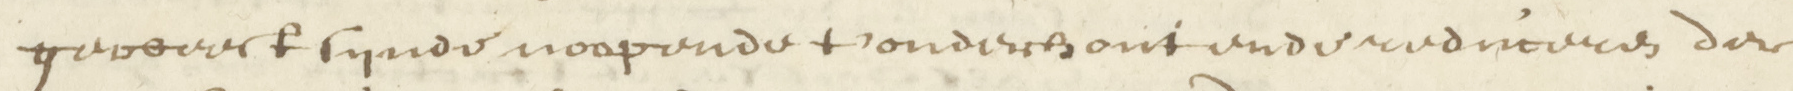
geweest synde noopende t'onderhout ende reduceren der
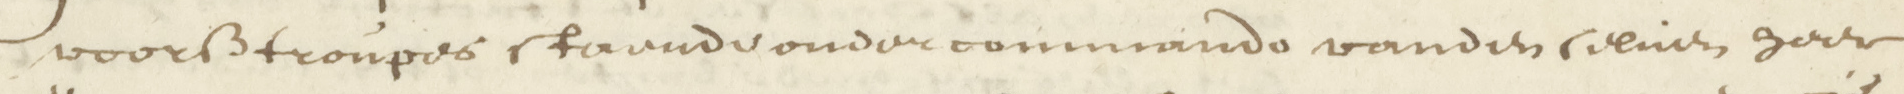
voors troupes staende onder commando vanden seluen heer
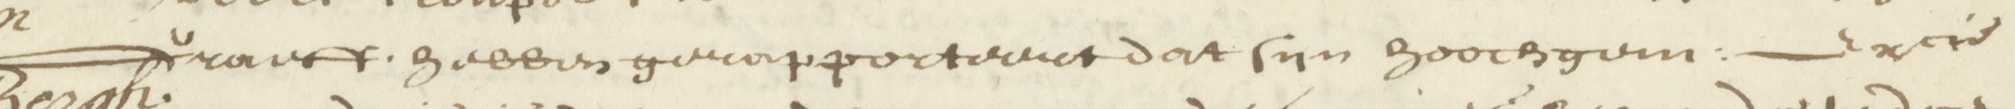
Graeff, hebben gerapporteert dat syn hoochgem: Excie
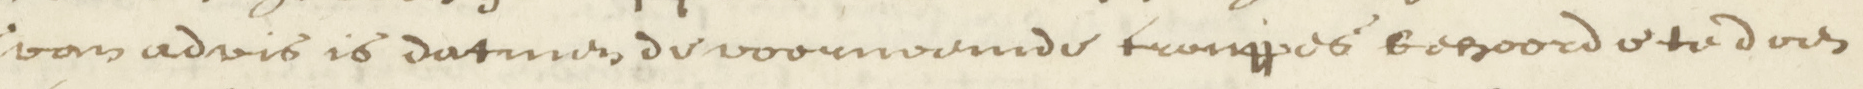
van advis is datmen de voornoemde trouppes behoorde te doen
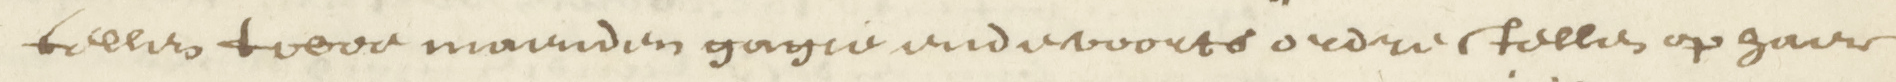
tellen twee maenden gagie ende voorts ordre stellen op haer
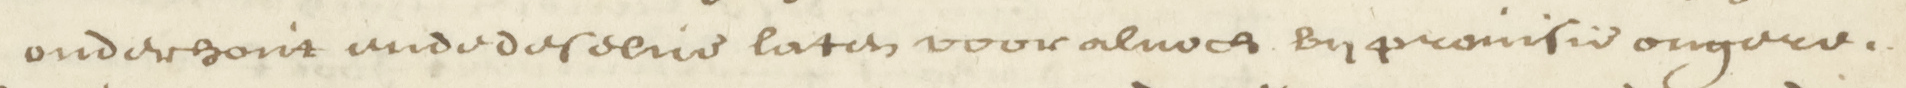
onderhout ende deselue laten voor alnoch bij prouisie ongere„
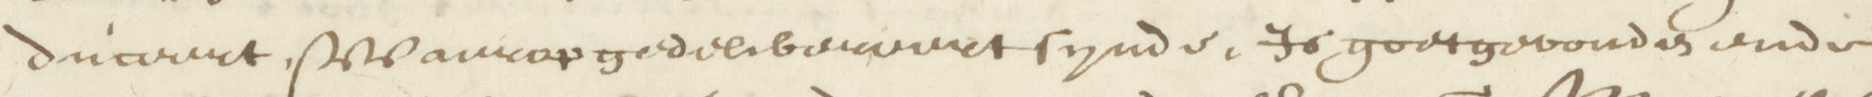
duceert. Waerop gedelibereert synde, Is goetgevonden ende
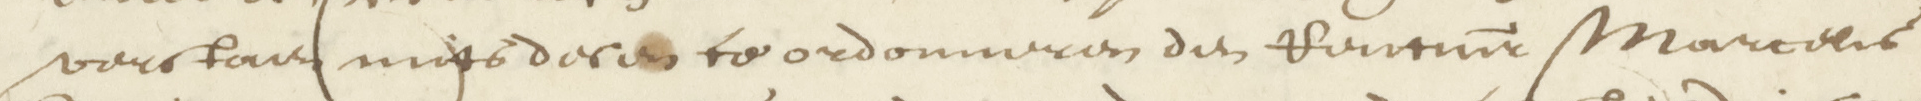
verstaen mits desen te ordonneren den Rentmr Marcelis
